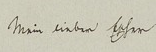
Mein lieber Escher
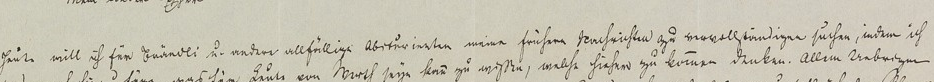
Heute will ich für Brändli u. andere allfällige Abiturienten meine frühern Nachrichten zu vervollständigen suchen, indem ich
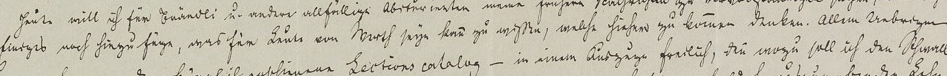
Einiges noch hinzufüge, was für Leute von Werth seyn kann zu wissen, welche hieher zu kommen denken. Allem Uebrigen
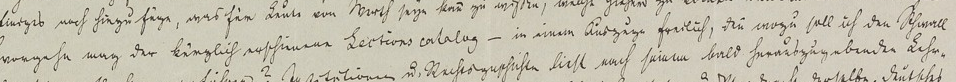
vorgehn mag der kürzlich erschienene Lectionscatalog – in einem Auszuge freilich, denn wozu soll ich den Schwall
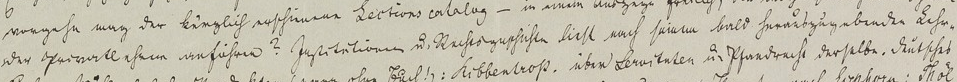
der Privatlehrer anführen? Institutionen u. Rechtsgeschichte liest nach seinem bald herauszugebenden Lehr-
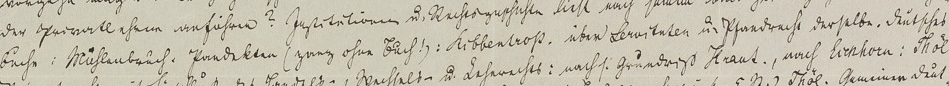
buche: Mühlenbruch. Pandekten (ganz ohne Buch!): Ribbentrop. Über Servituten u. Pfandrecht derselbe. Deutsches
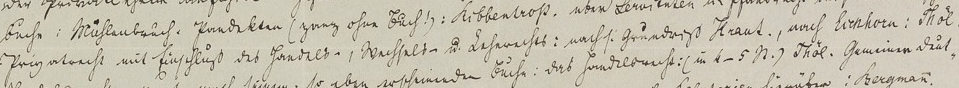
Privatrecht mit Einschluss des Handels-, Wechsels- u. Lehnrechts: nach s. Grundriss Kraut., nach Eichhorn: Thöl.
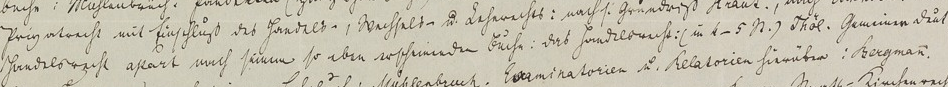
Handelsrecht apart nach seinem so eben erscheinenden Buche: das Handelsrecht: (in 4–5 St.) Thöl. Gemeinen deut-
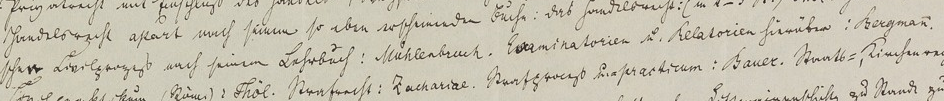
schen Civilprocess nach seinem Lehrbuch: Mühlenbruch. Examinatorien u. Relatorien hierüber: Bergmann.
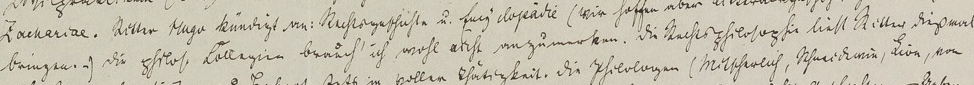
bringen.) Die philos. Collegien brauch' ich wohl nicht anzumerken. Die Rechtsphilosophie hält Ritter diessmal
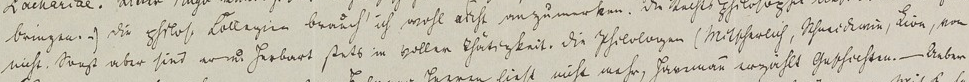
nicht. Sonst aber sind er u. Herbart stets in voller Thätigkeit. Die Philologen (Mitscherlich, Schneidewin, Lion, von
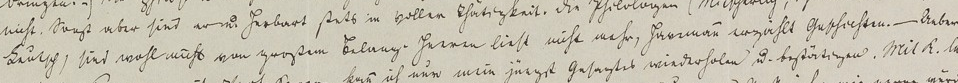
Leutsch) sind wohl nicht von grossem Belang. Heeren liest nicht mehr, Havemann erzählt Geschichten. – Ueber
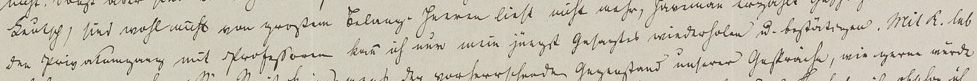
den Privatumgang mit Professoren kann ich nur mein jüngst Gesagtes wiederholen u. bestätigen. Mit R. leb
